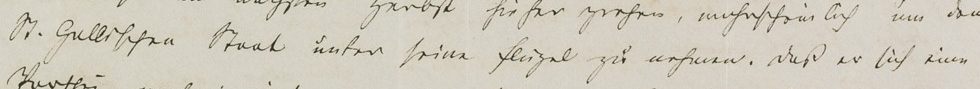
St. Gallischen Staat unter seine Flügel zu nehmen. Daß er sich eine
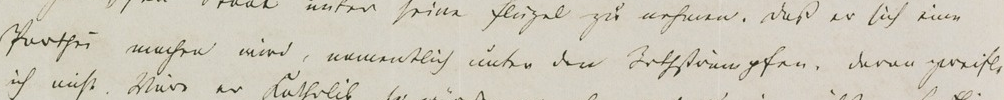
Parthei machen wird, namentlich unter den Rothstrümpfen, daran zweifle
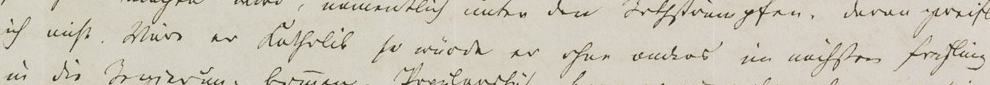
ich nicht. Wäre er Katholik so würde er ohne anders im nächsten Frühling
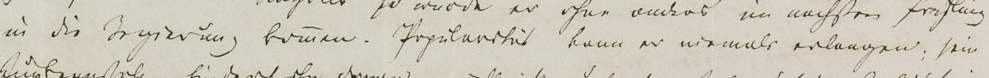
in die Regierung kommen. Popularität kann er niemals erlangen; sein
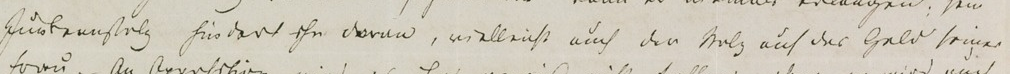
Junkernstolz hindert ihn daran, vielleicht auch der Stolz auf das Geld seiner
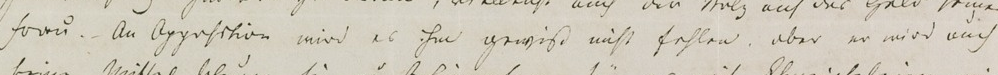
Frau. An Opposition wird es ihm gewiß nicht fehlen, aber er wird auch
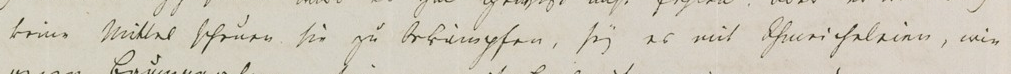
keine Mittel scheuen sie zu bekämpfen, sey es mit Schmeicheleien, wie
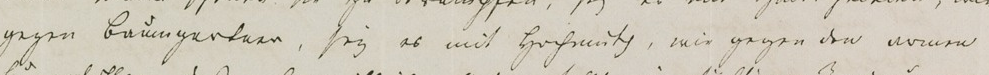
gegen Baumgartner, sey es mit Hochmuth, wie gegen den armen
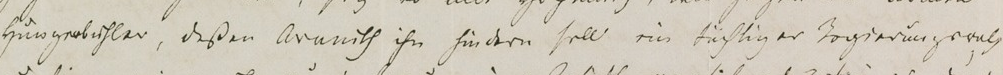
Hungerbühler, deßen Armuth ihn hindern soll ein tüchtiger Regierungsrath
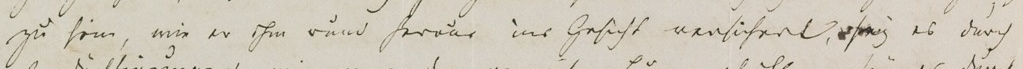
zu sein, wie er ihm rund heraus ins Gesicht versichert, sey es durch
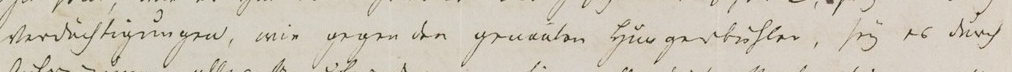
Verdächtigungen, wie gegen den genannten Hungerbühler, sey es durch
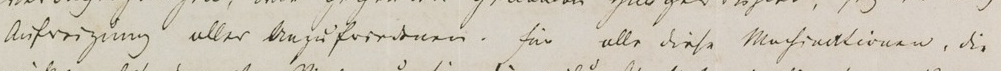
Aufreizung aller Unzufriedenen. Für alle diese Machinationen, die
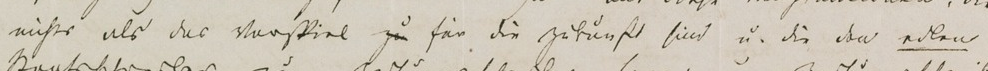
nichts als das Vorspiel zu für die Zukunft sind u. die den edlen
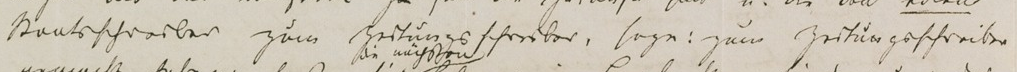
Staatsschreiber zum Zeitungsschreiber, sage: zum Zeitungsschreiber
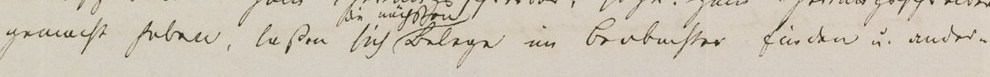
gemacht haben, laßen sich die nächsten Belege im Beobachter finden u. ander-
